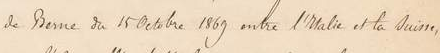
de Berne du 15 Octobre 1869 entre l´Italie et la Suisse,
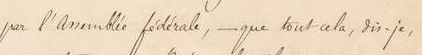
par l´Assemblée fédérale, – que tout cela, dis-je,
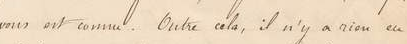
vous est connu. Outre cela, il n´y a rien eu
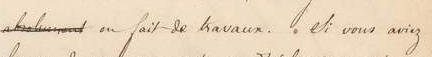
absolument en fait de travaux. Si vous aviez
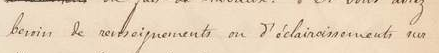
besoin de renseignements ou d´éclaircissements sur
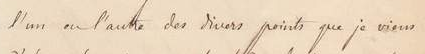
l´un ou l´autre des divers points que je viens
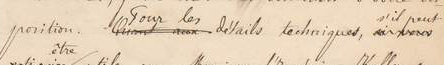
position. Quant auxPour les détails techniques, si vouss´il
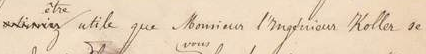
être utile que Monsieur l´Ingénieur Koller se
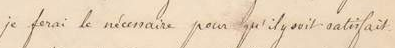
je ferai le nécessaire pour qu´il y soit satisfait.
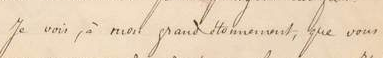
Je vois, à mon grand étonnement, que vous
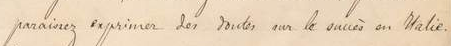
paraissez exprimer des doutes sur le succès en Italie.
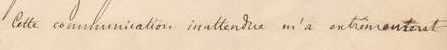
Cette communication inattendue m'a extrêmement
